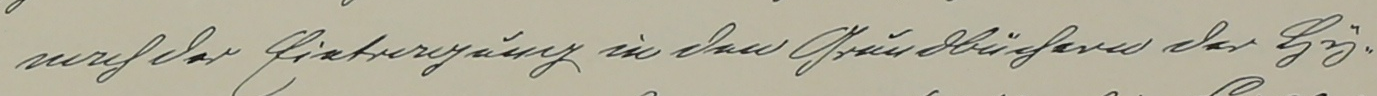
nach der Eintragung in den Grundbüchern der Hy-
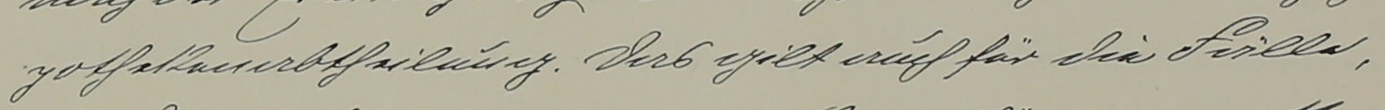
pothekenabtheilung. Das gilt auch für die Fälle,
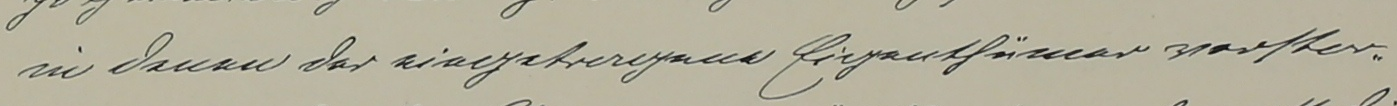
in denen der eingetragene Eigenthümer verstor-
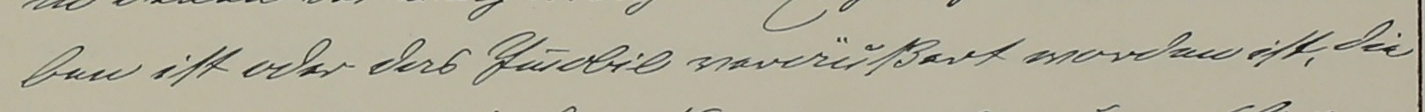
ben ist oder das Immobil veräußert worden ist, die
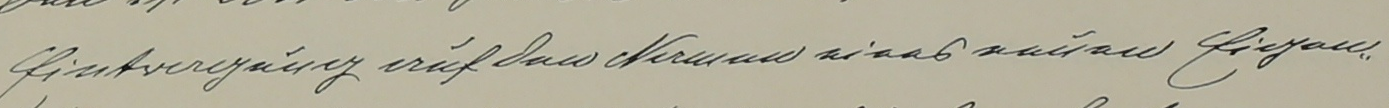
Eintragung auf den Namen eines neuen Eigen-
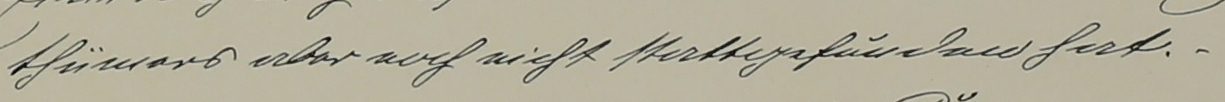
thümers aber noch nicht stattgefunden hat.
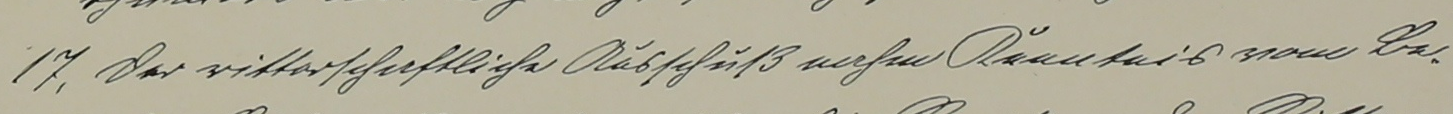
17. Der ritterschaftliche Ausschuß nahm Kenntnis vom Be-
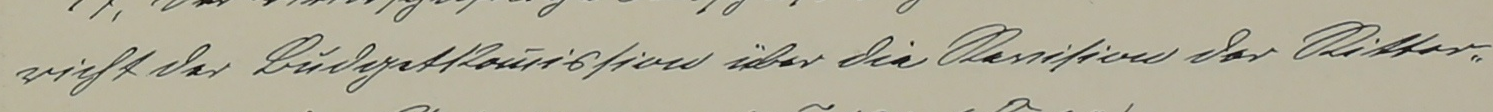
richt der Budgetkommission über die Revision der Ritter-
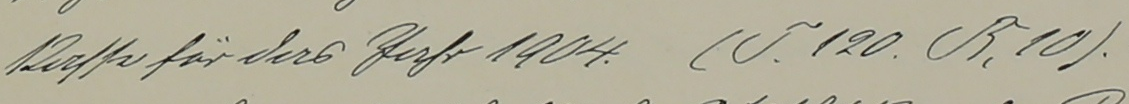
kasse für das Jahr 1904. (T.120. R.10).
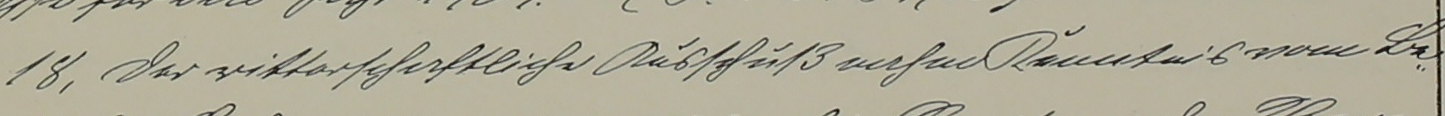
18. Der ritterschaftliche Ausschuß nahm Kenntnis vom Be-
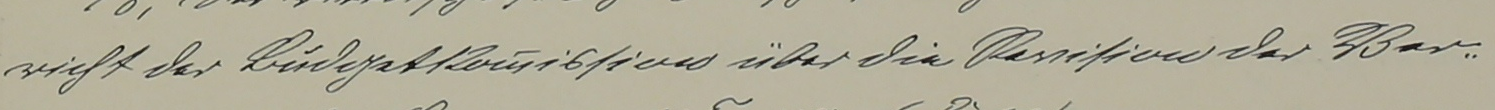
richt der Budgetkommission über die Revision der Ver-
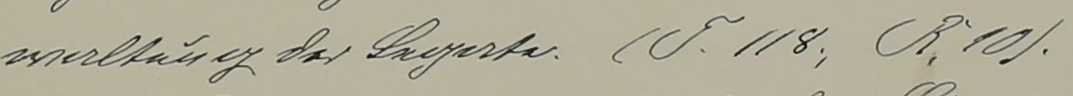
waltung der Legate. (T.118; R.10).
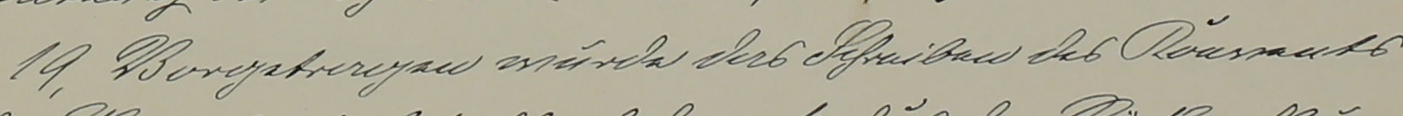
19. Vorgetragen wurde das Schreiben des Konvents
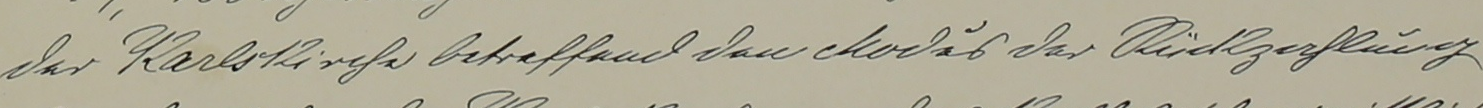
der Karlskirche betreffend den Modus der Rückzahlung
